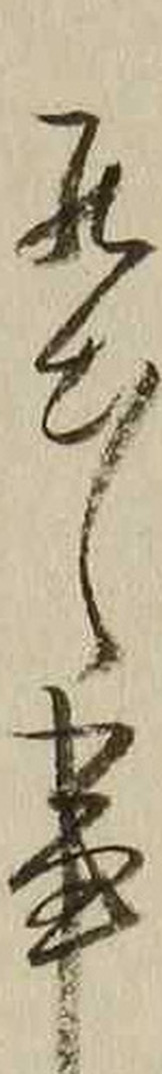罷出候事
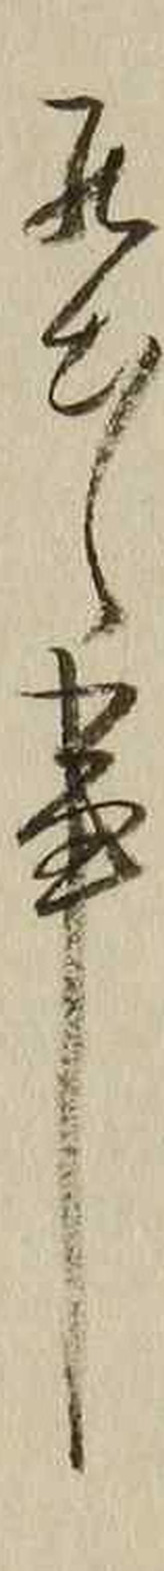罷出候事
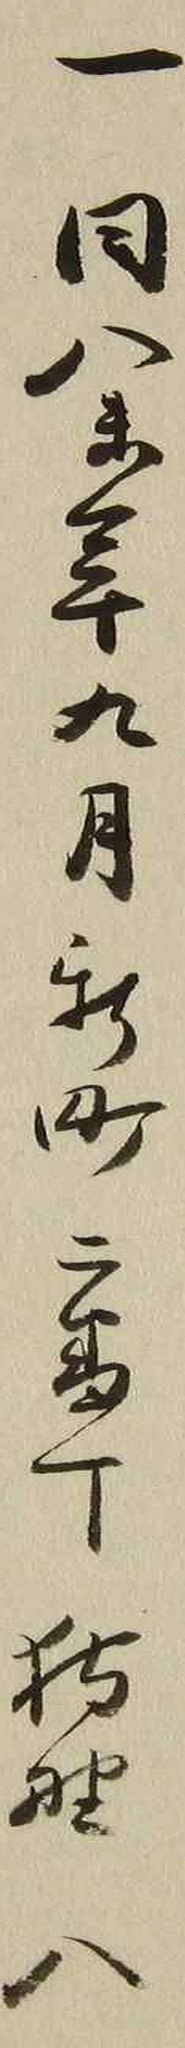一同八未年九月新町二番丁狩野八
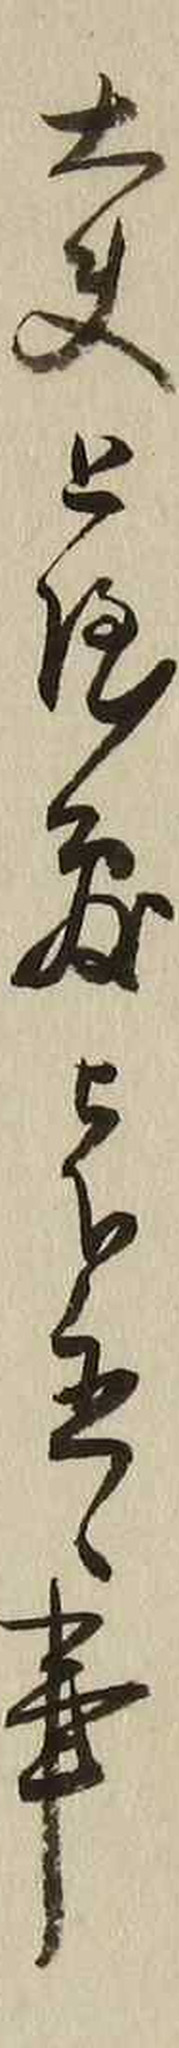大夫上屋敷被下置候事
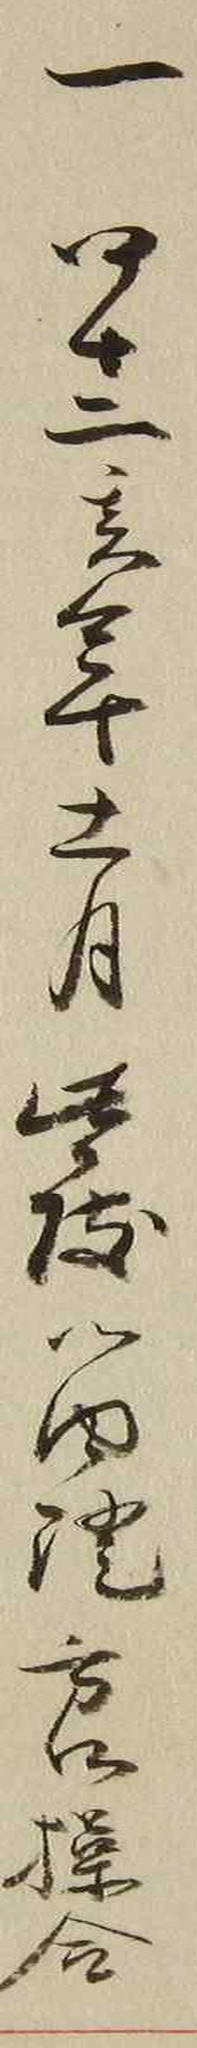一同十二亥年十一月此度御内証方御操合
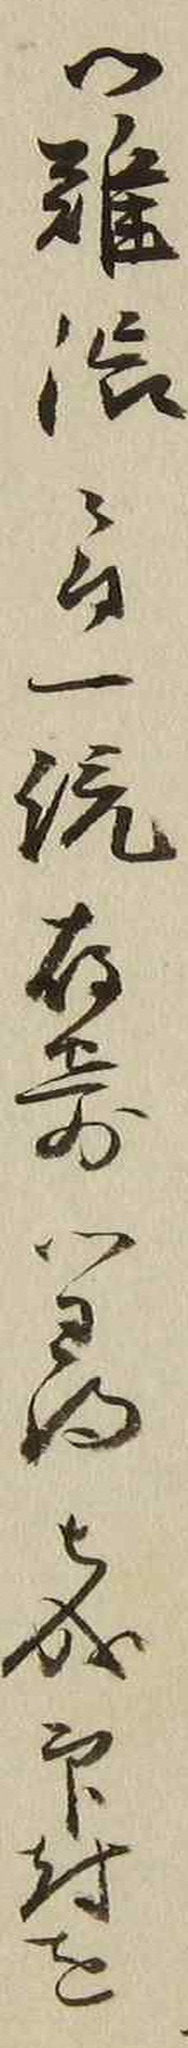御難渋ニ付一統存寄御尋被成印封を
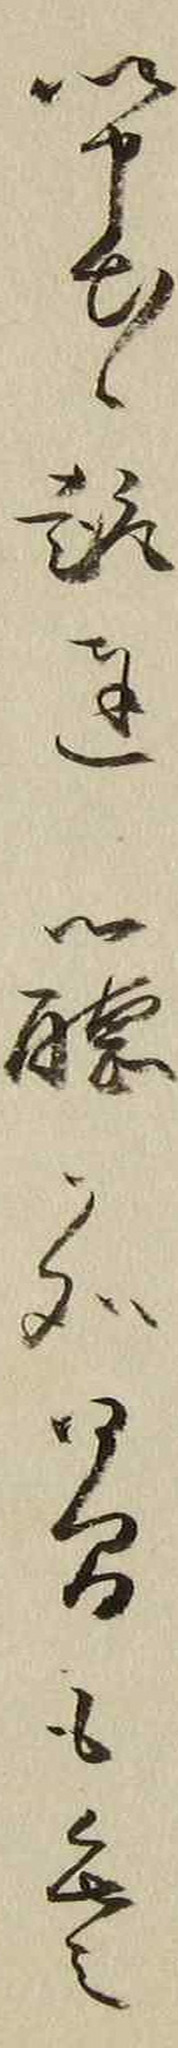以申出候趣達御聴候処日間も無之
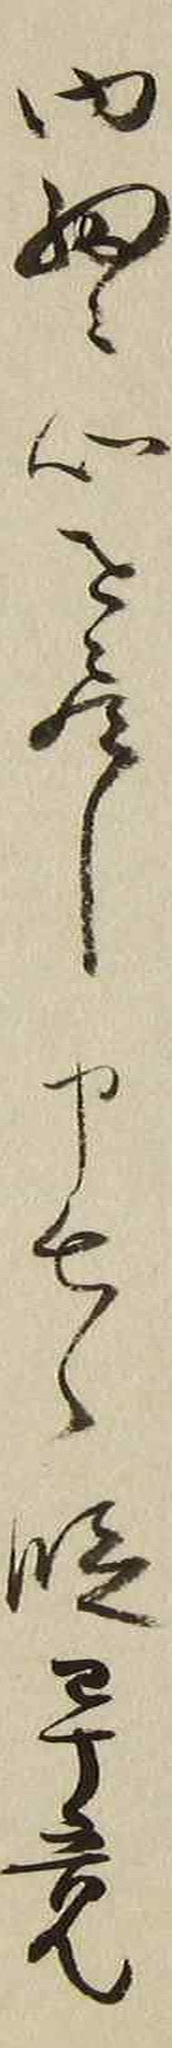内細々心を尽し申出候段畢竟
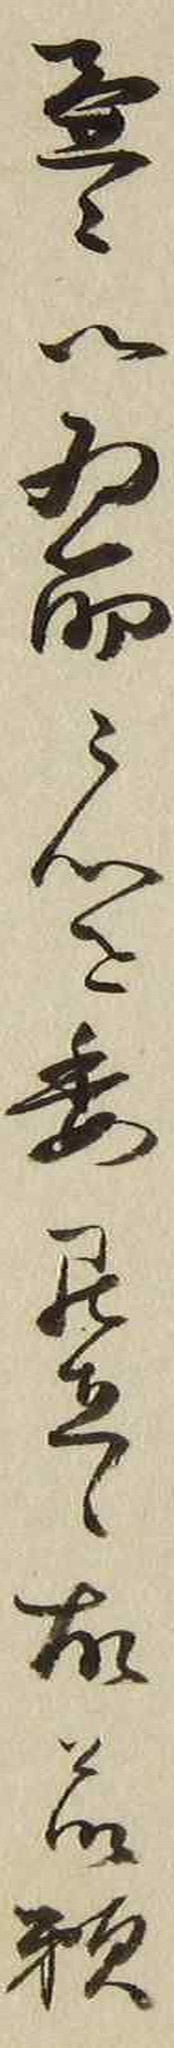兼々御為筋ニ心を委罷在候故と御頼
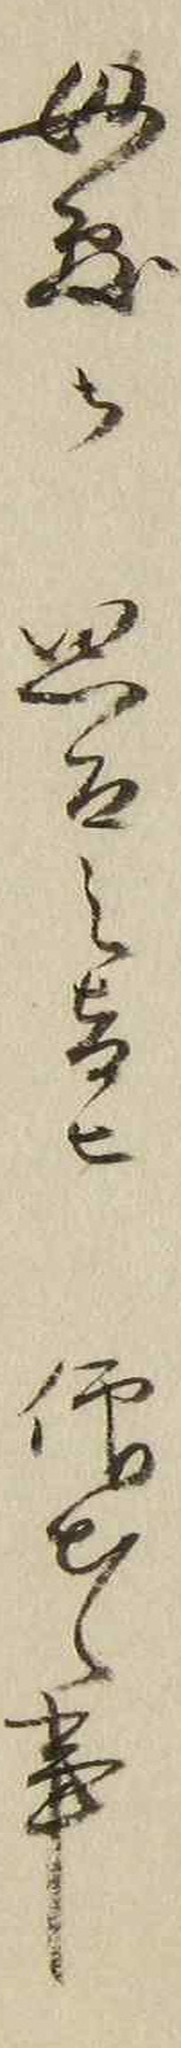毋敷被思召之旨被仰出候事
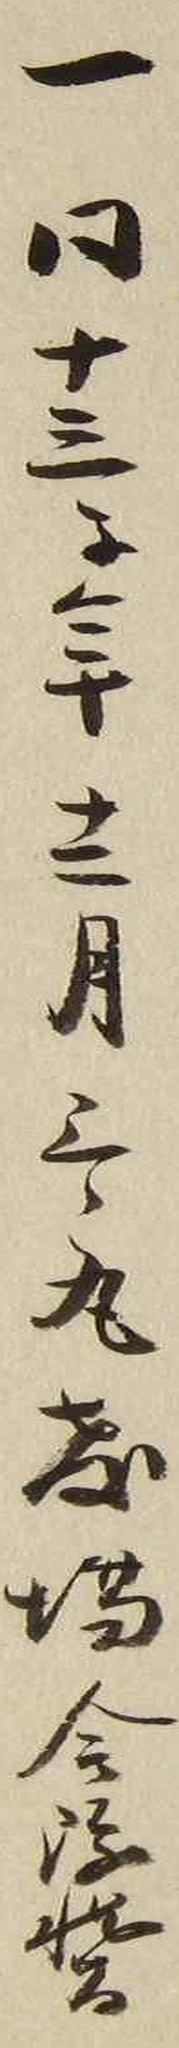一同十三子年十二月三ノ丸教場合隊稽
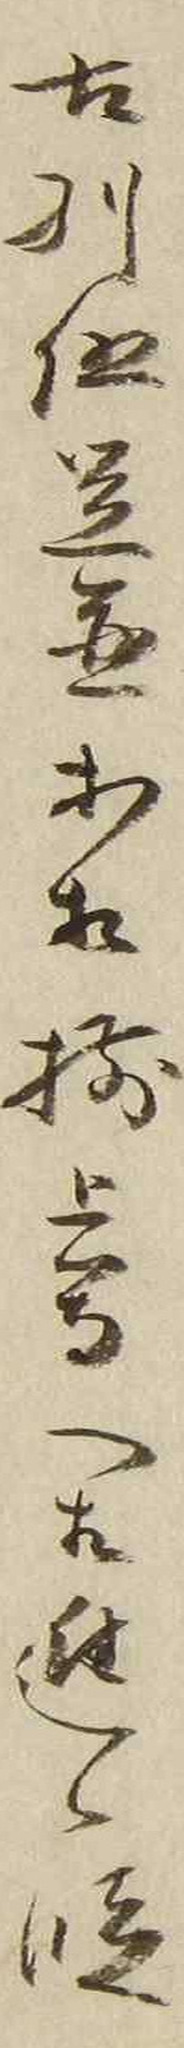古列伍足並等相揃上等へ相進候段

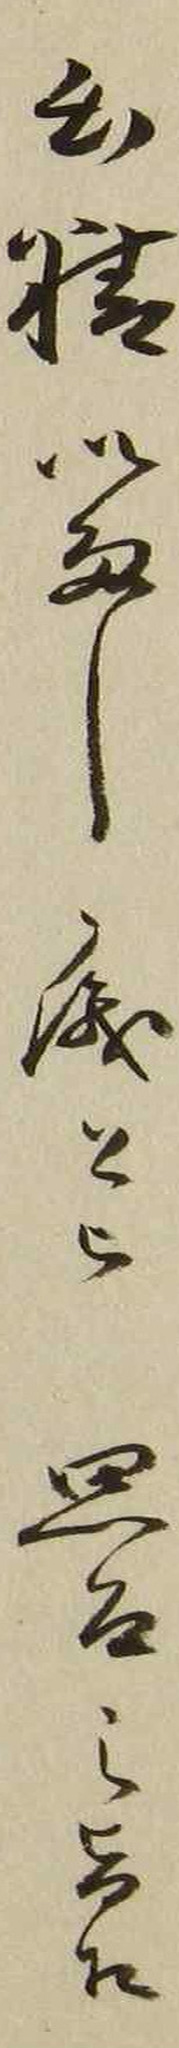出精いたし候儀と被思召之旨相
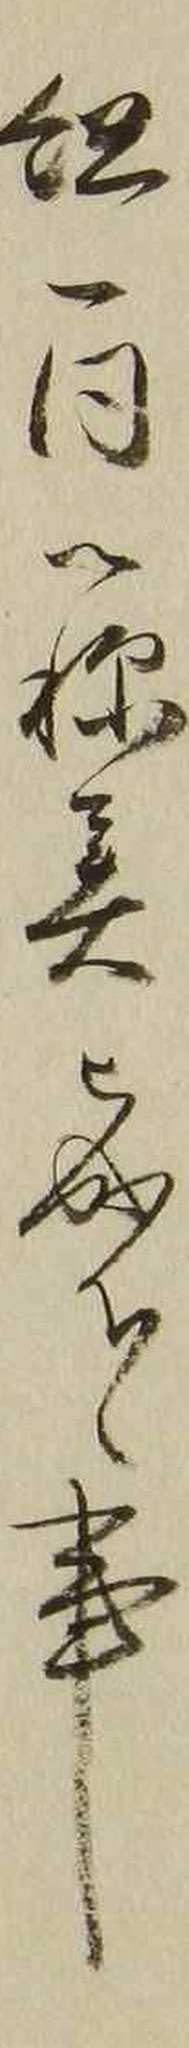組一同御称美被成下候事
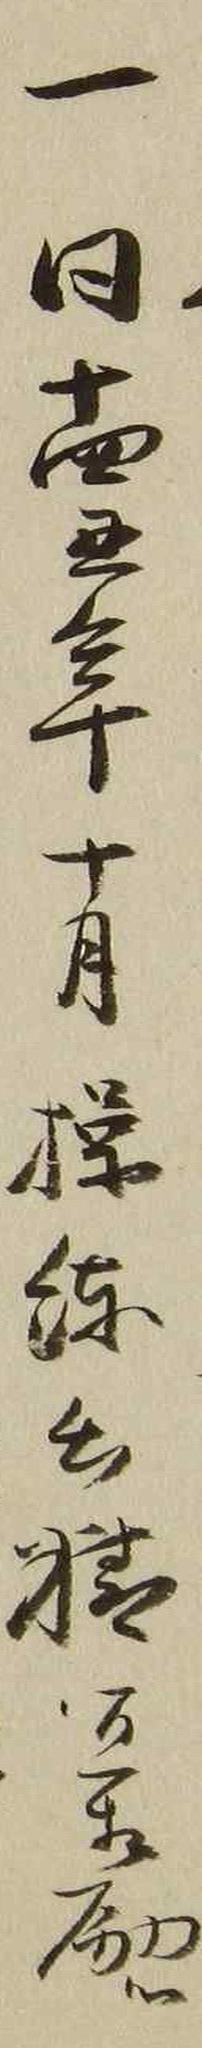一同十四丑年十月操練出精宜相励候
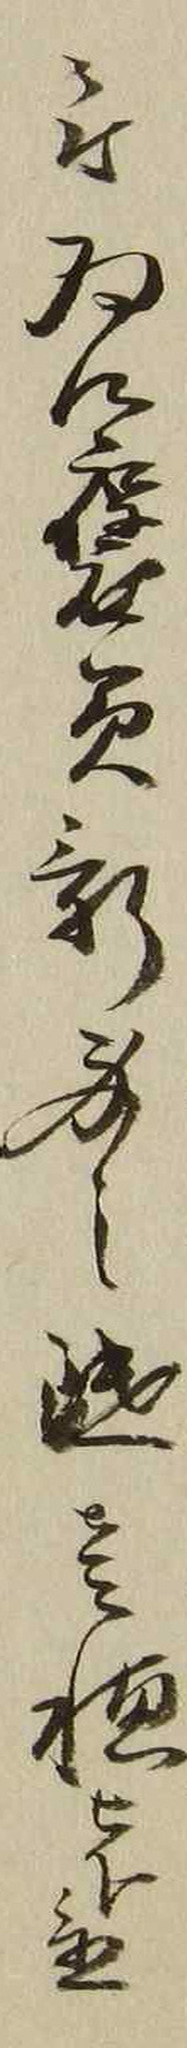ニ付為御褒美新身之鑓壱穂被下置
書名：諸士系譜　巻之288　さ之部20
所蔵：会津若松市立会津図書館
